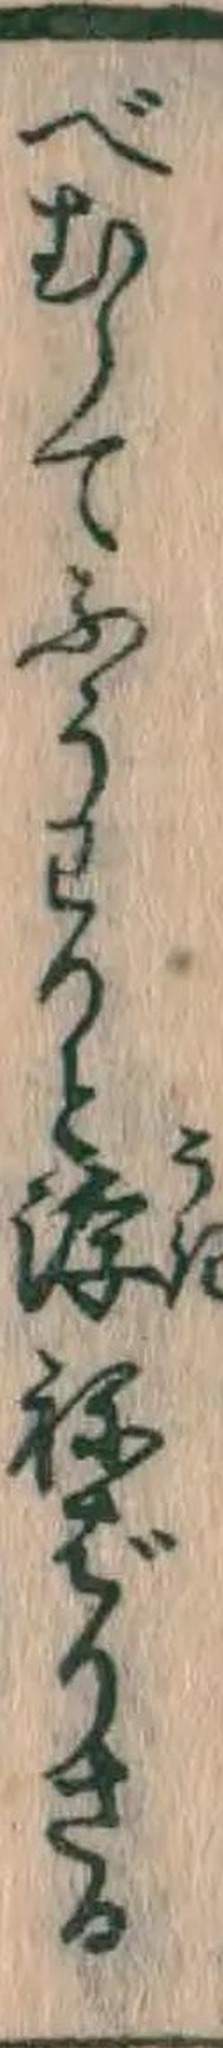べむしてふうわりと浮ねばりさる
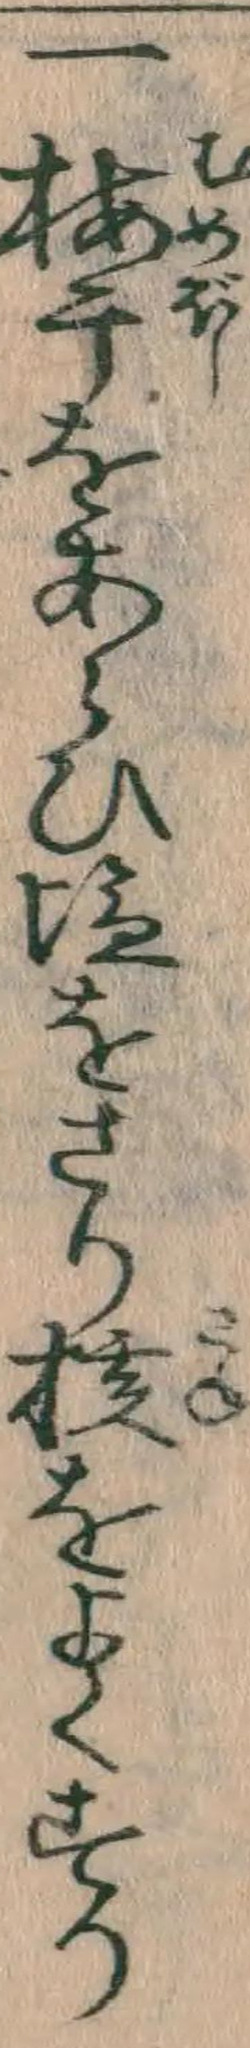一梅干をあらひ塩をさり核をよくすり
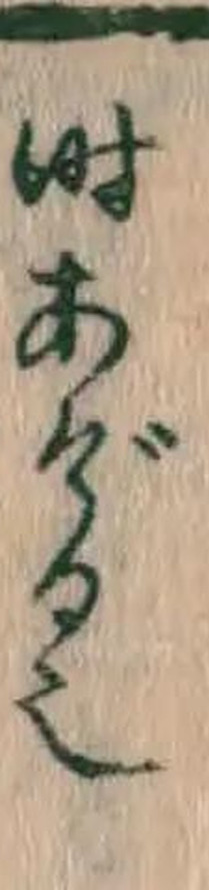時あげる也
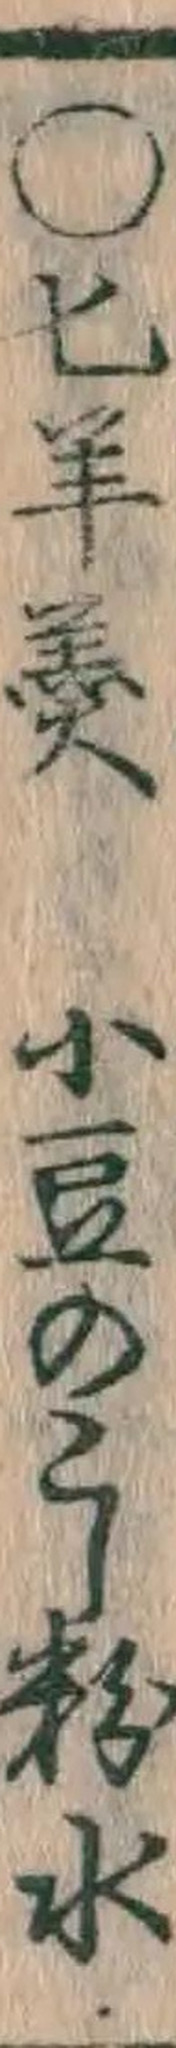○匕羊羹小豆のこし粉水
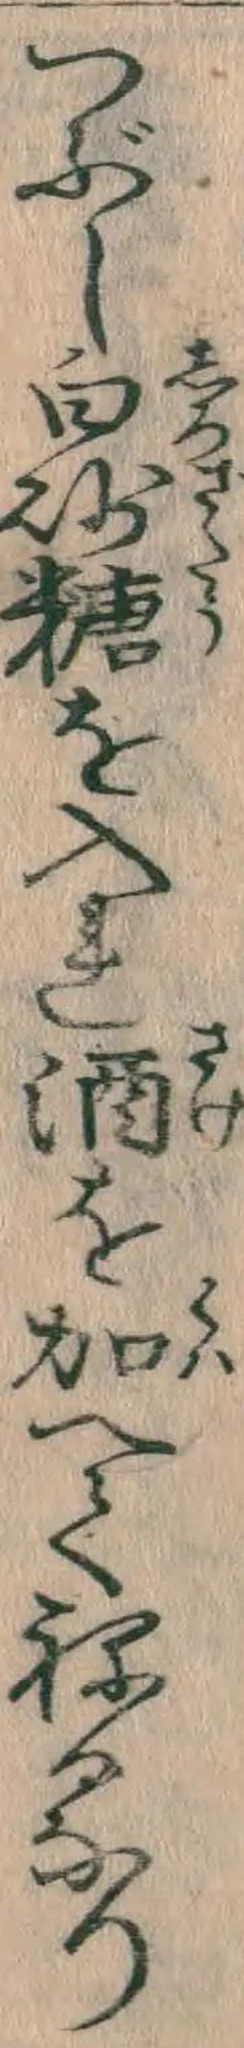つぶし白砂糖を入れ酒を加へてねるなり
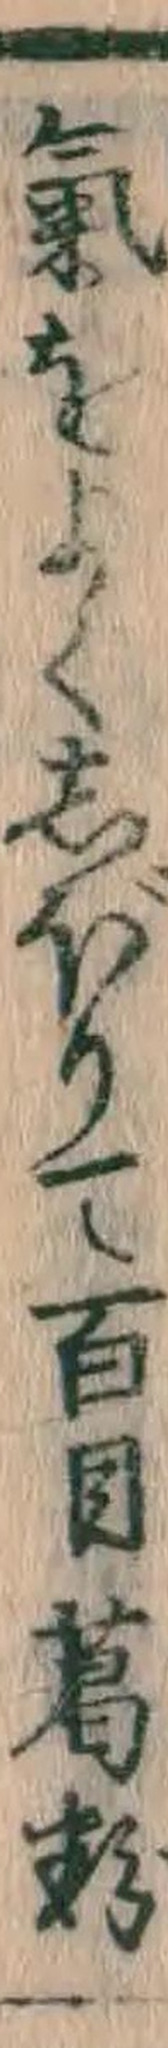気をよくしぼりて百目葛粉
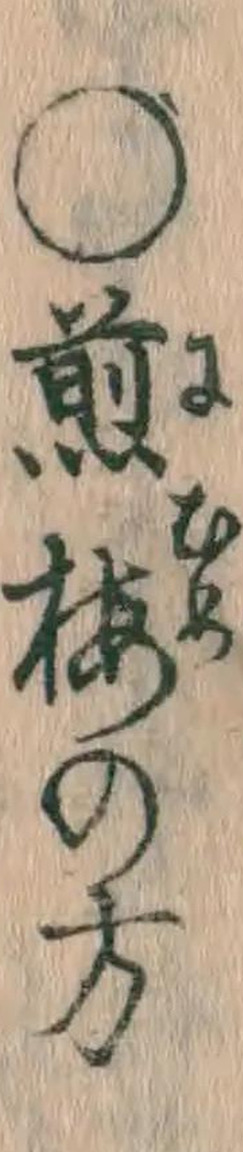○煎梅の方
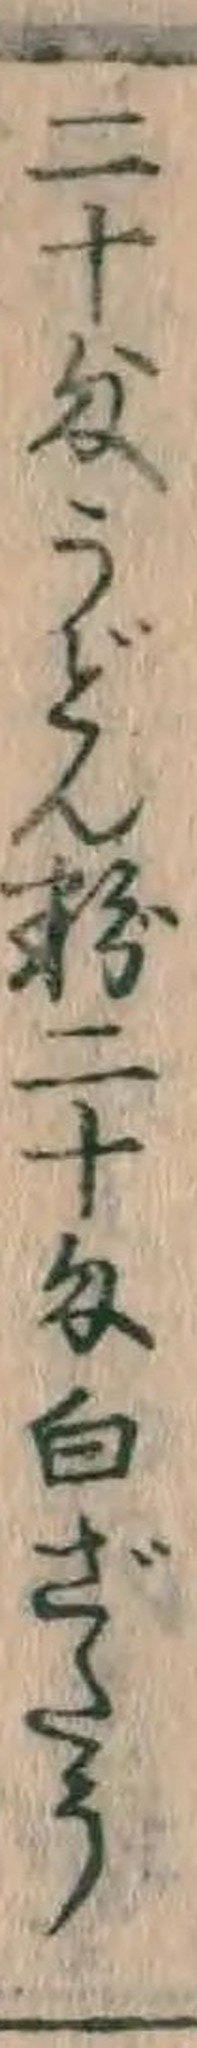二十匁うどん粉二十匁白ざたう
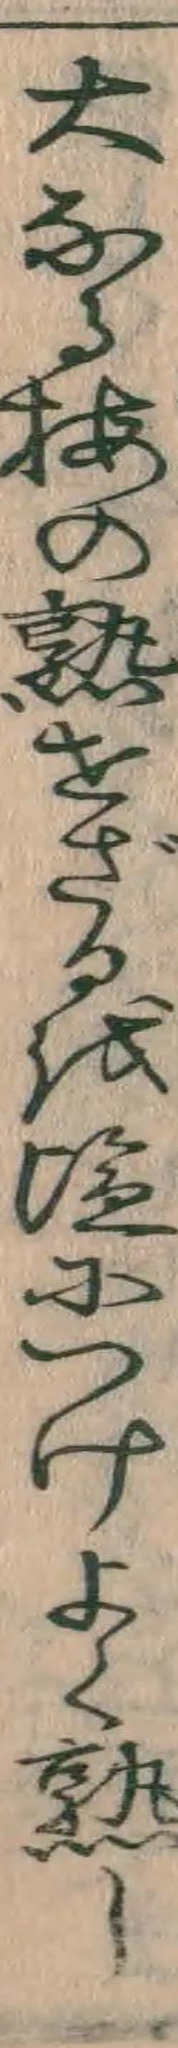大なる梅の熟せざるを塩につけよく熟し
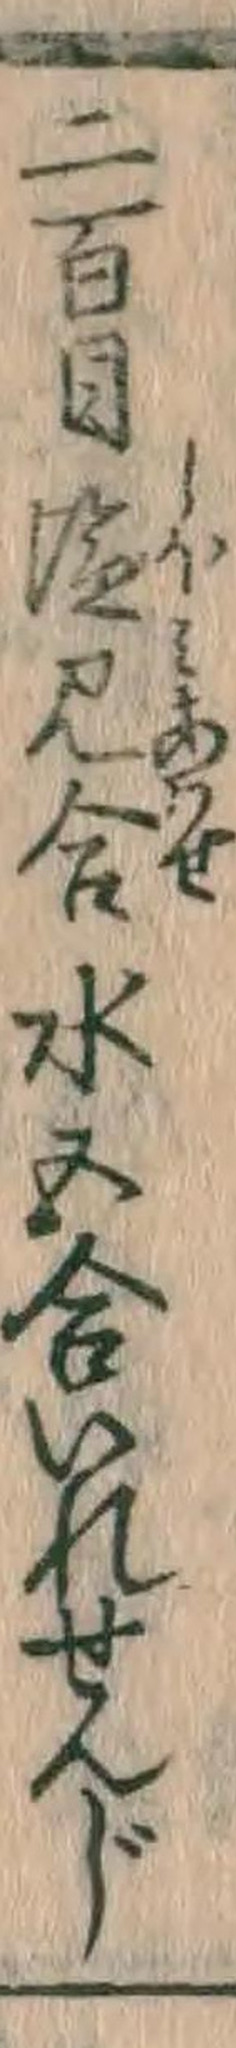二百目塩見合水五合いれせんじ
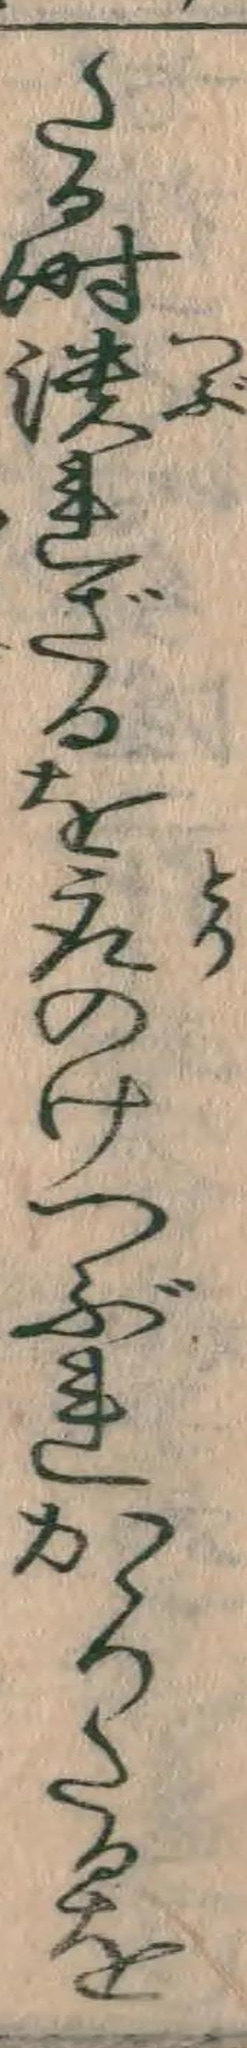たる時潰れざるを取のけつぶれかゝりたるを
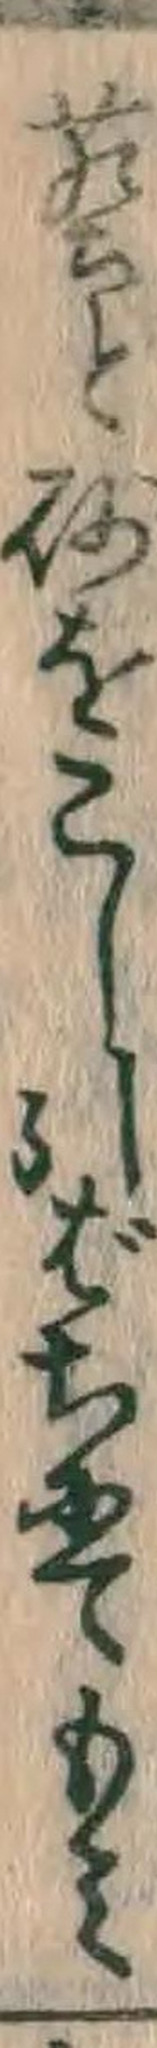塵と砂をこし引ばちにてもみ
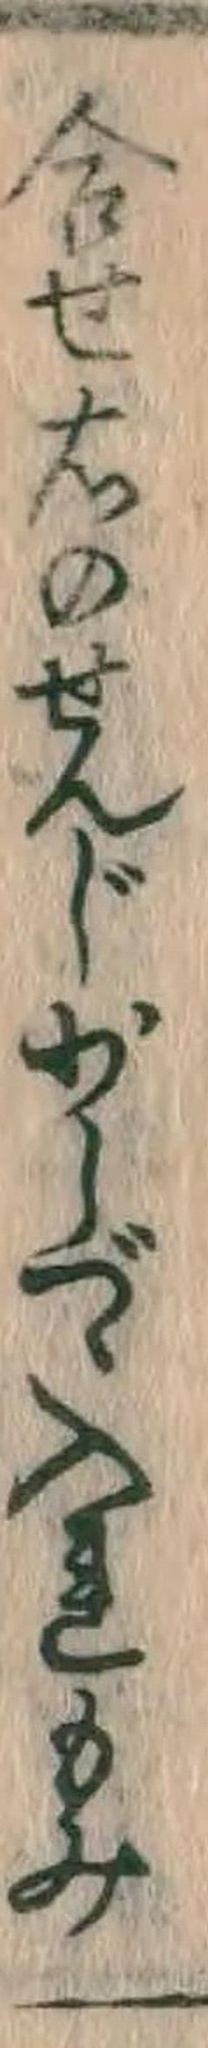合せ右のせんじ少しづゝ入れもみ
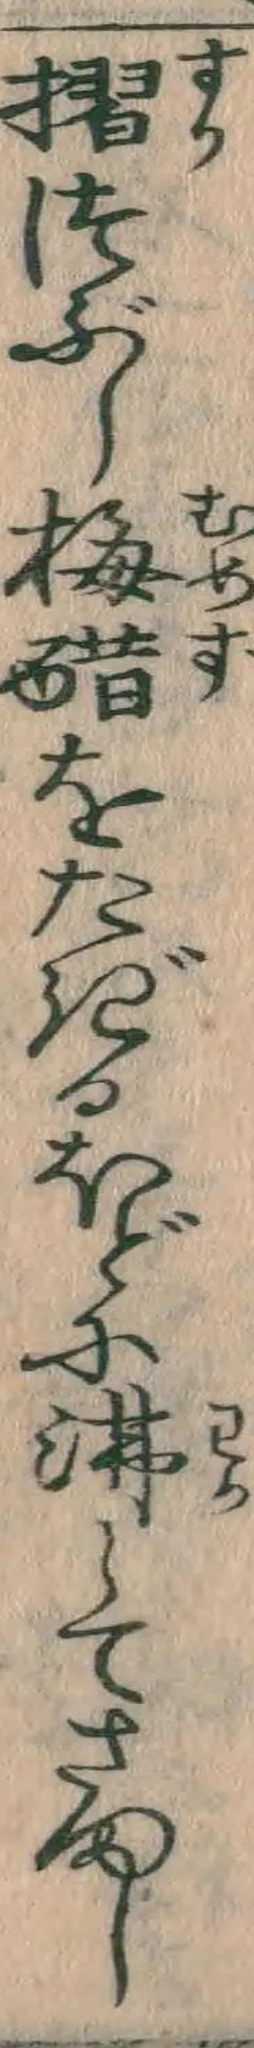摺つぶし梅醋をたぎるほどに沸してさまし
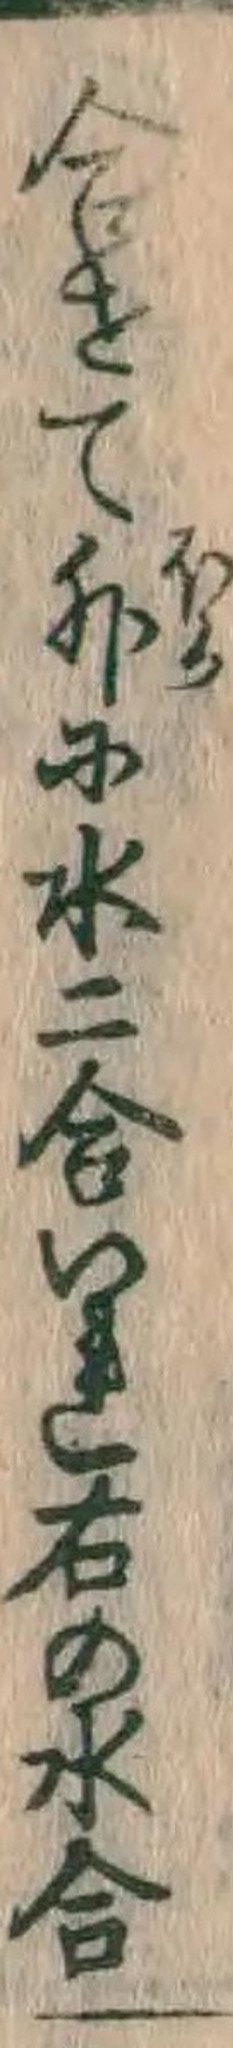合せて外に水二合いれ右の水合
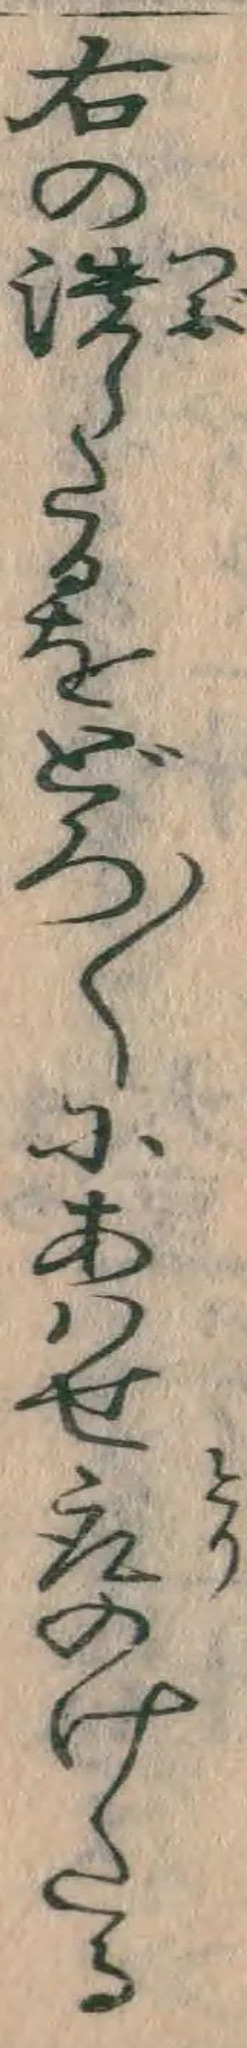右の潰したるをどろ〳〵にあはせ取のけたる
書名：広益秘事大全 3巻. [5]
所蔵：国立国会図書館 National Diet Library, JAPAN
